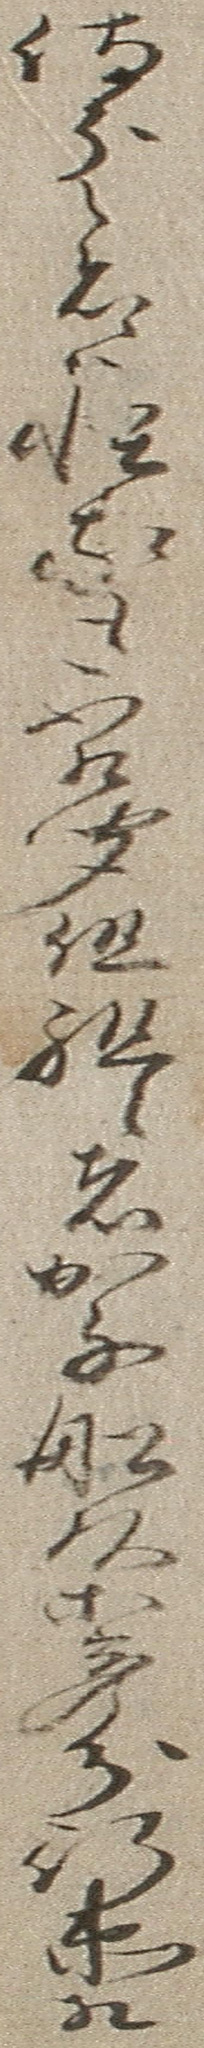侍分之者は怪我も不相聞但組之者か子船頭等多分行衛相
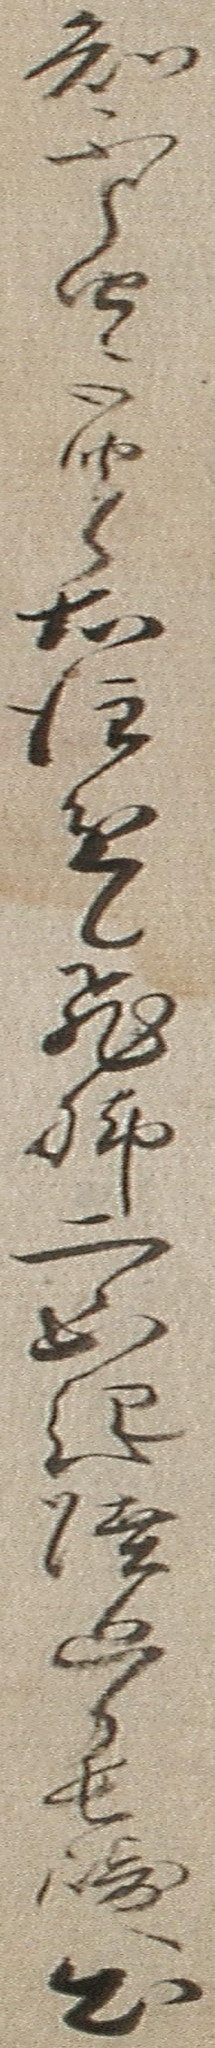知不申候由に御座候右注進候飛脚二日出起陸廻り長崎へ出
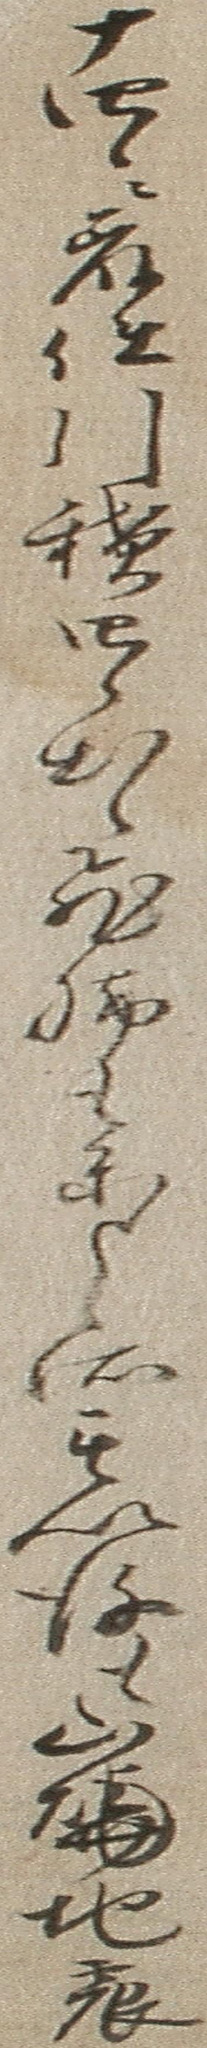十四日に着仕引積四日出候飛脚も参申候所其以後も山焼地震
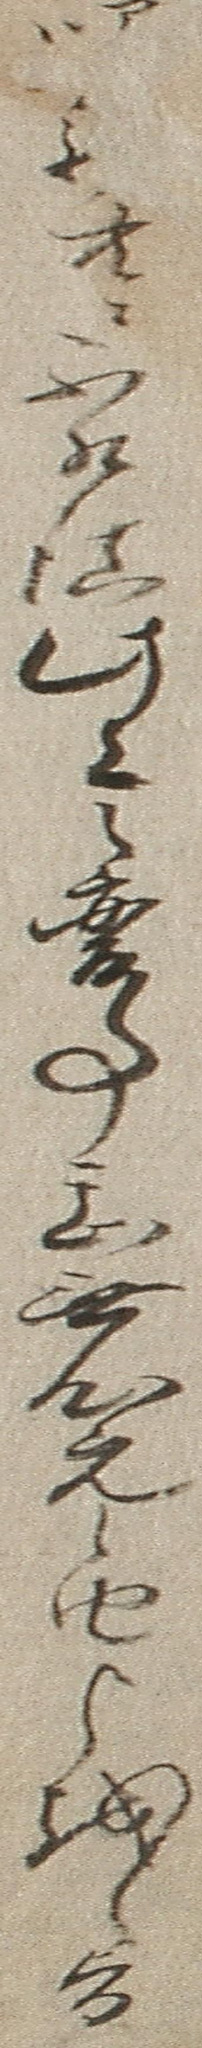鳴動共に不相鎮此上之変事甚無心元之由申越候旨

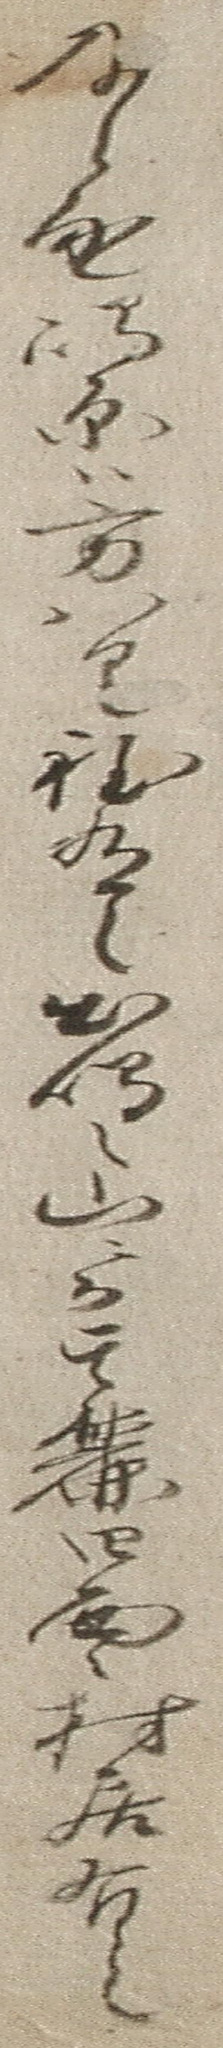及候通島原は方八里程有之出島の山に而其麓四面に村居有之
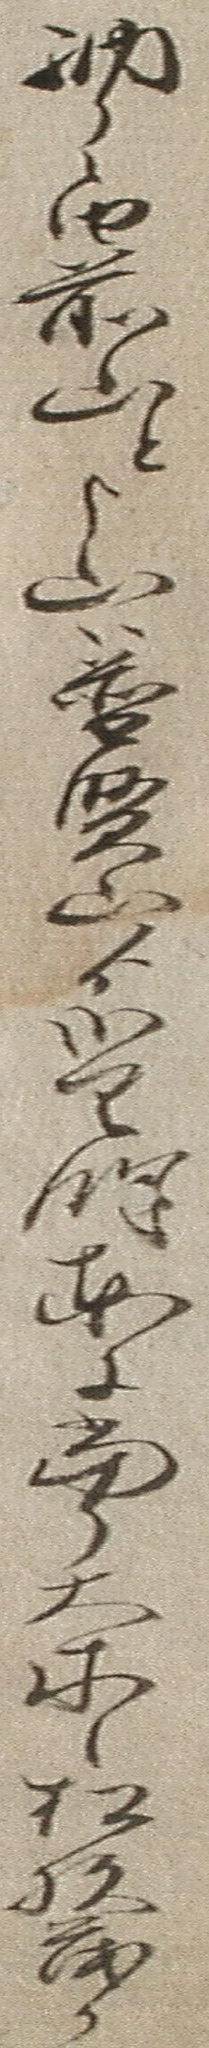納り候由前山と申山は普賢山ゟ弐里余東に当り大木之松杉茂り
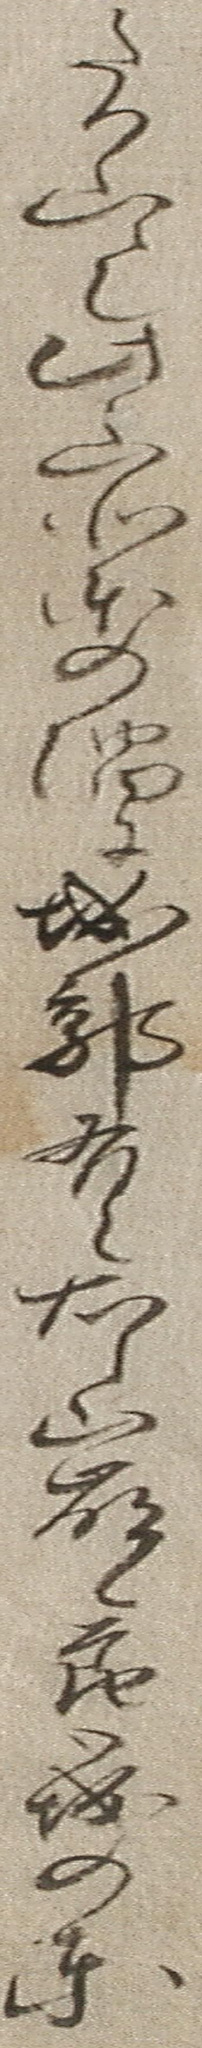たる山に候此山北東の脇？に城郭有之右山崩候節御城の東
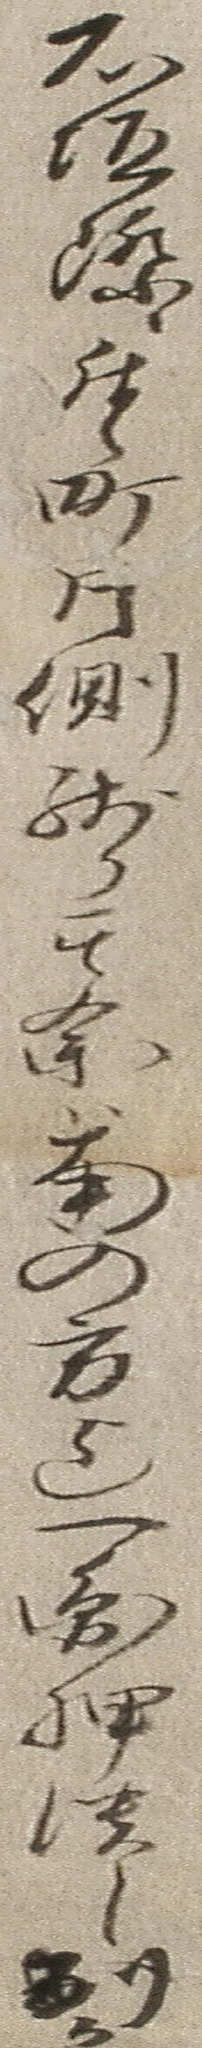石垣際に付候町片側残り其余は南の方迄一円押潰し別而
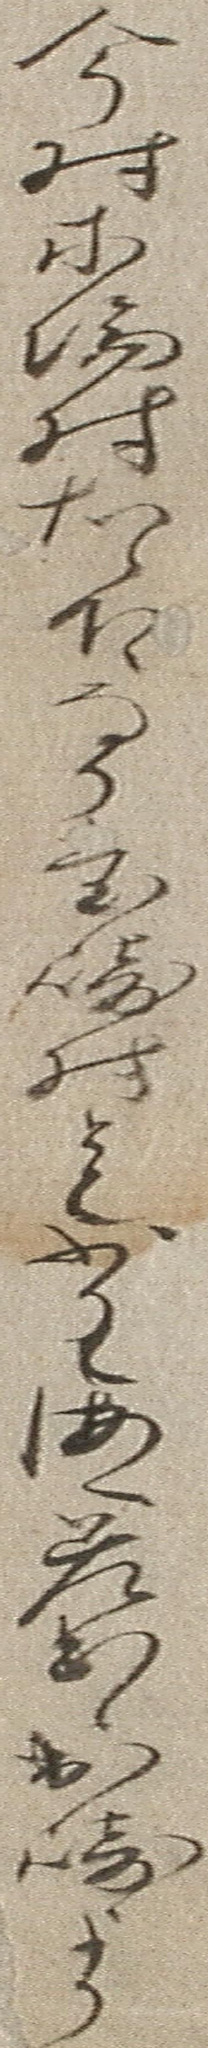今村木場村右下なり堂？崎村と申候少し海へ差出候出崎より
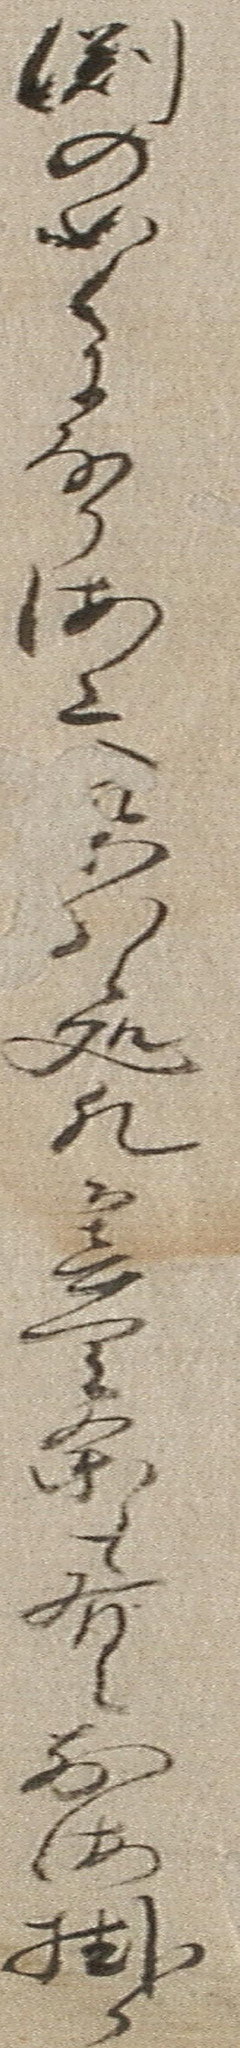渕の如くになり海上へ乗？出候処凡而壱里余も有之前海掛り
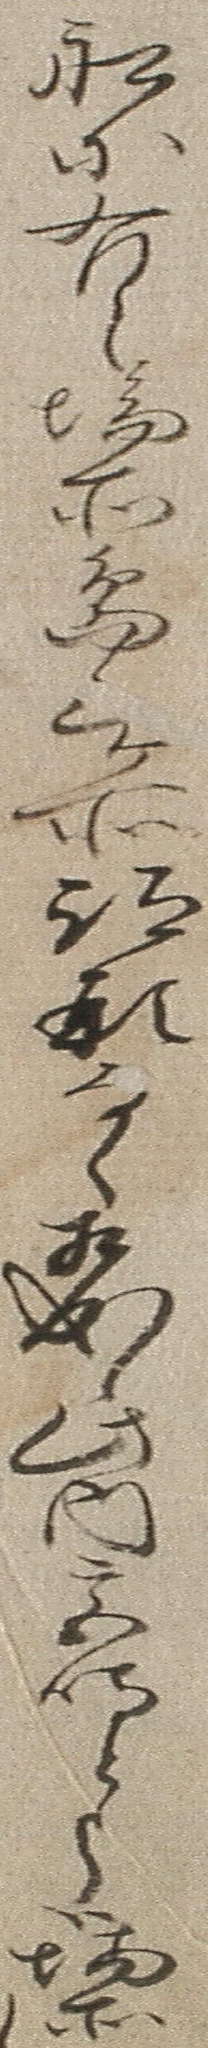船に有之場所島三ヶ所跡形なく相成候此内宮島と申候御場所も
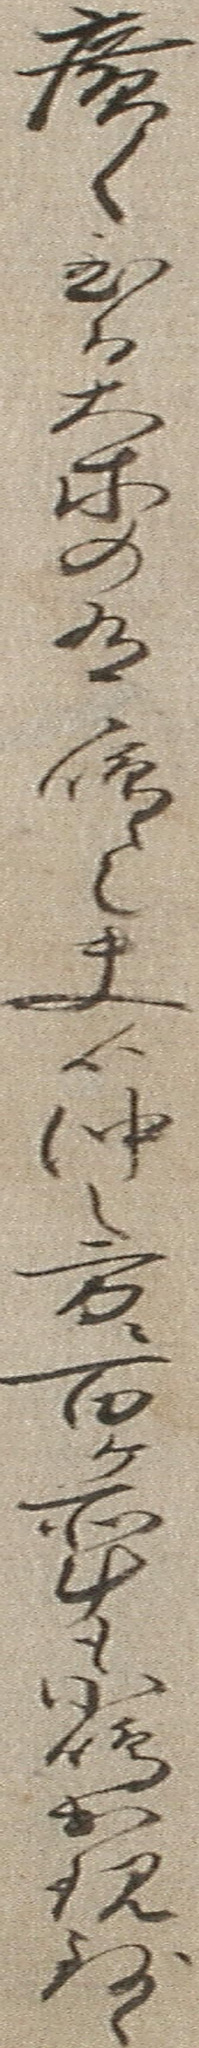広く至而大木の有島に候夫ゟ沖之方に百ヶ所斗も小島出現致候
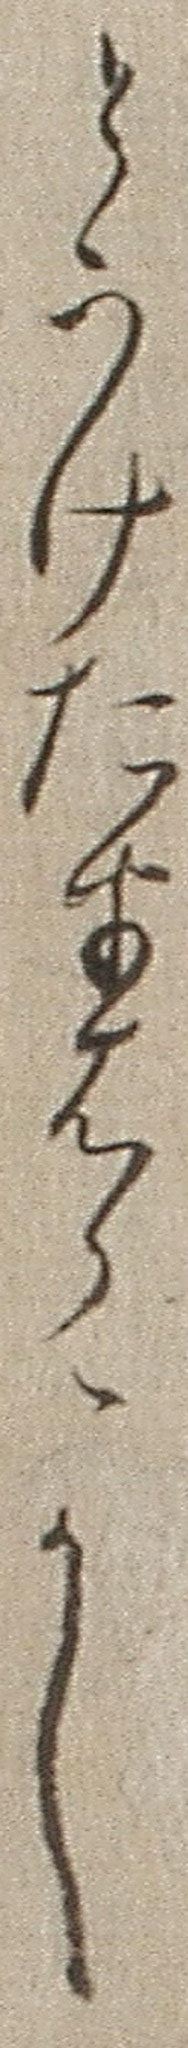とうけたまはり候よし
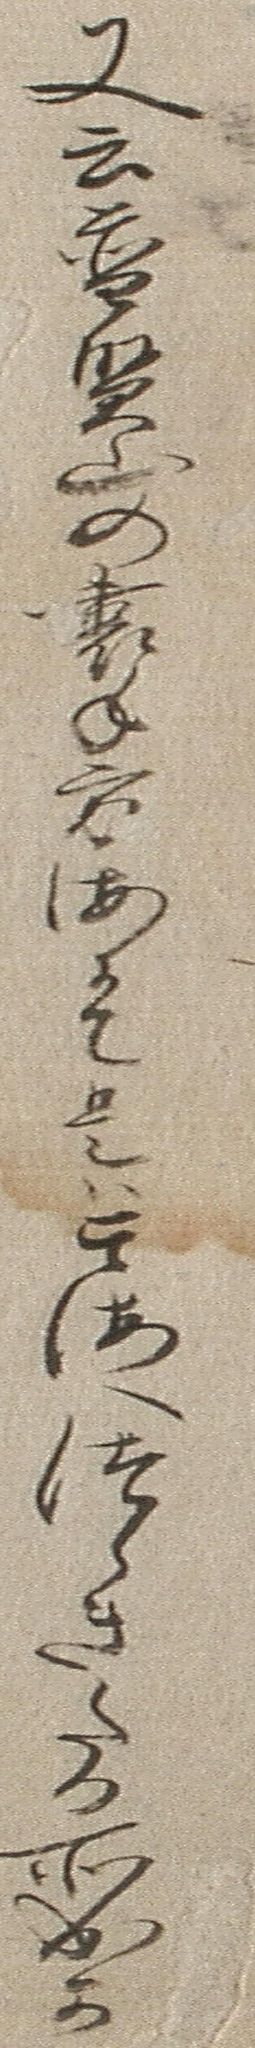又云普賢山の裏手方海にて是は其海へツゝきたる所成か
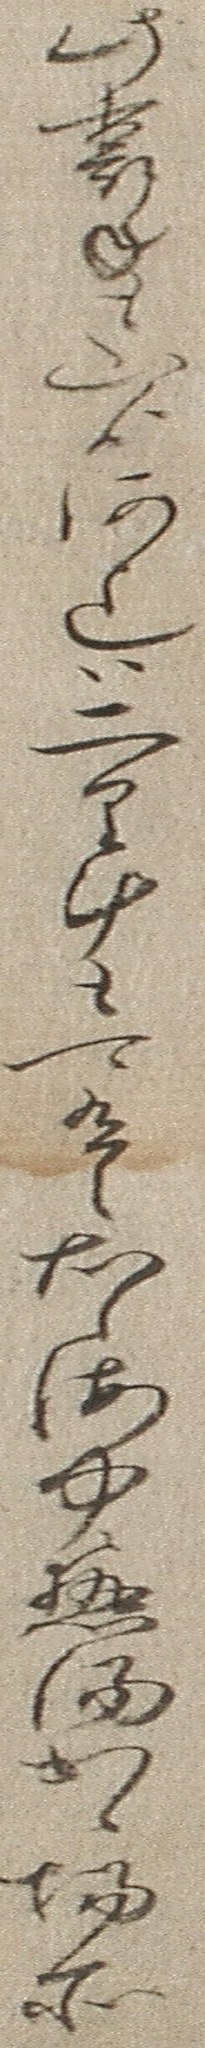此裏手も山ゟ河迄は二里斗も可有之右之海中に熱湯出候場所
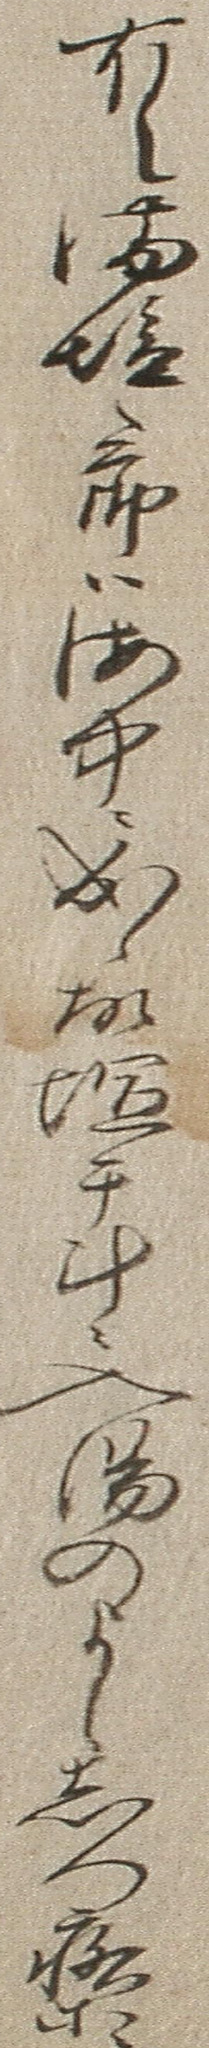有之満塩之節は海中に成候故塩干斗に入湯のよししつ病等に
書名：太平秘録抜書　浅間山燒及普賢山崩
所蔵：東京大学地震研究所図書室 Earthquake Research Institute Library, The University of Tokyo, JAPAN
